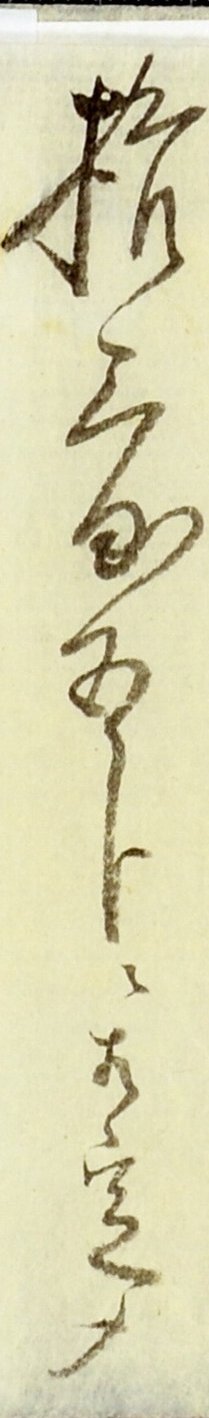拾三匁五分に相定メ
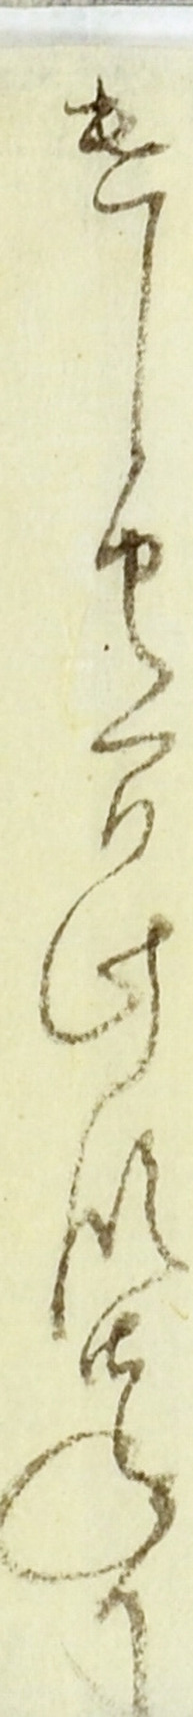遣し申候間此段御承引
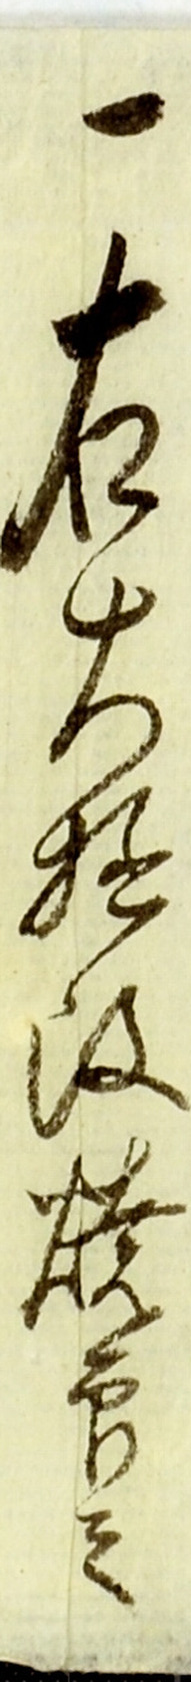一右大極改焼印之
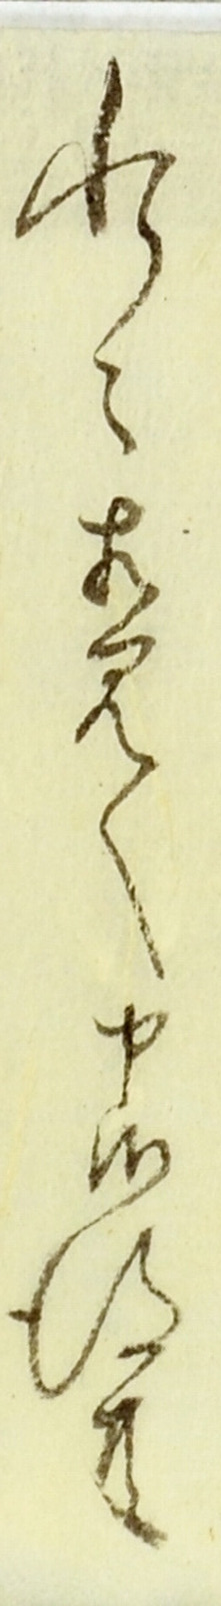少々相見へ申候得共
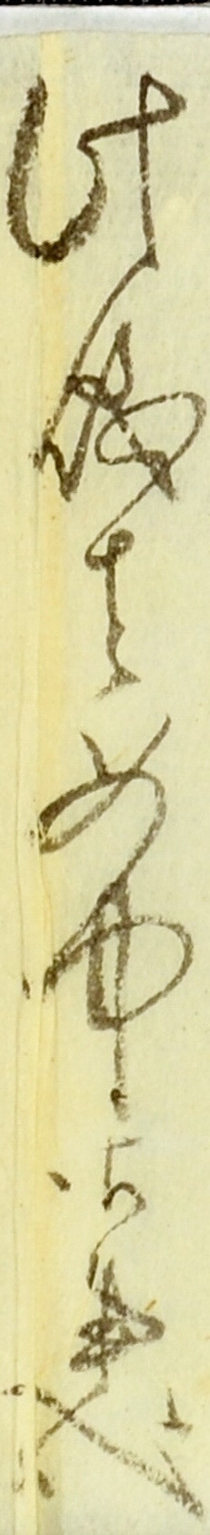此儀は如何御事哉
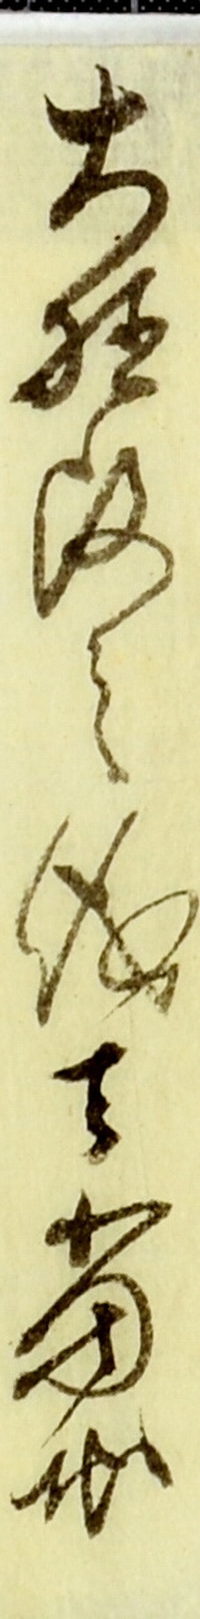大極改之儀は当地
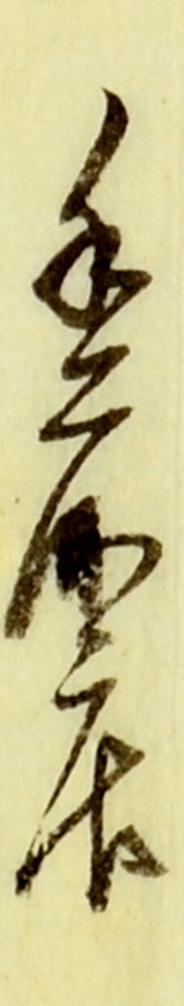手前店
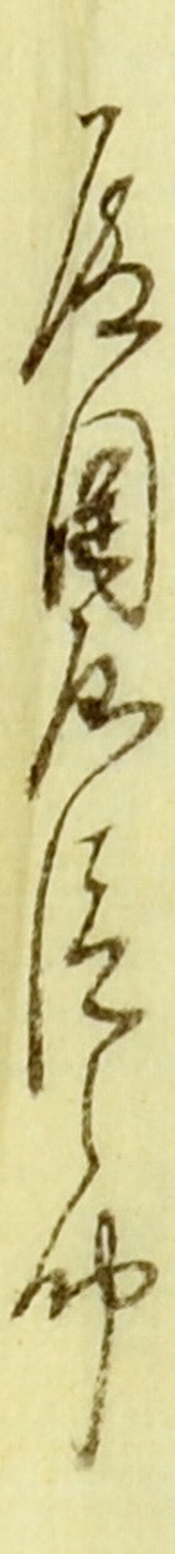殿岡屋清之助
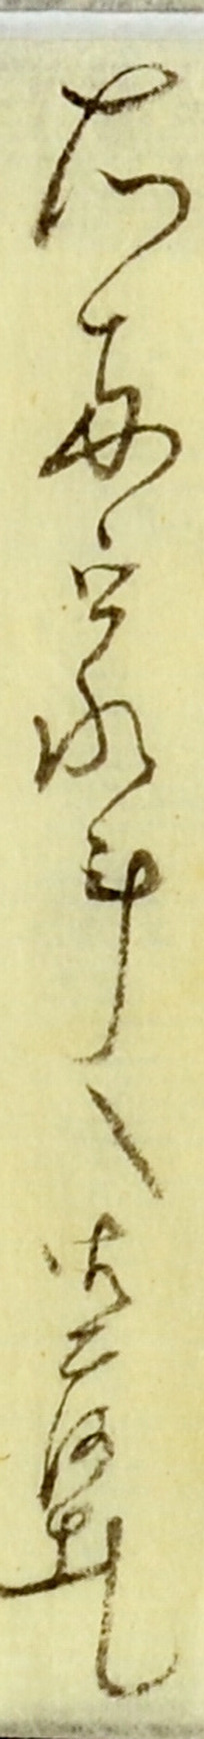右両家計へ御荷出し
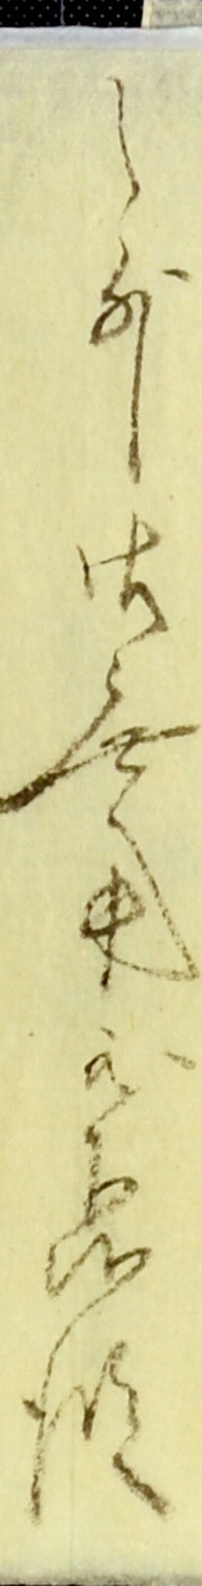之外御無用可被下候段
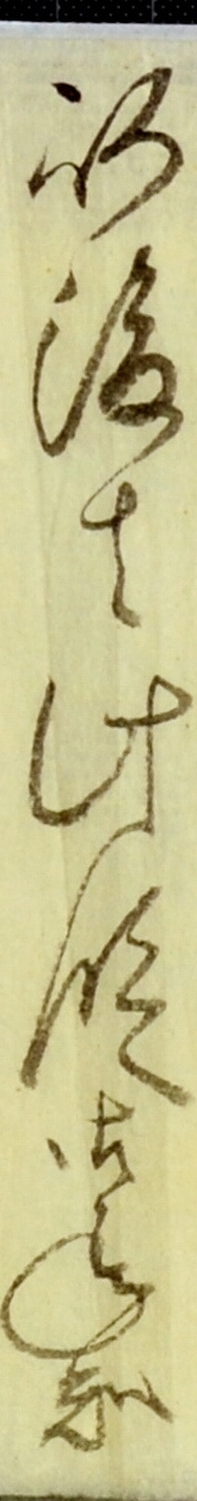以後は此段御承知
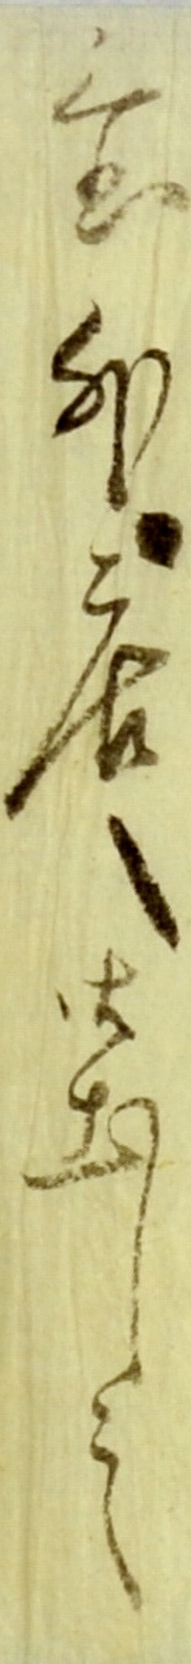置外店へ御出し之

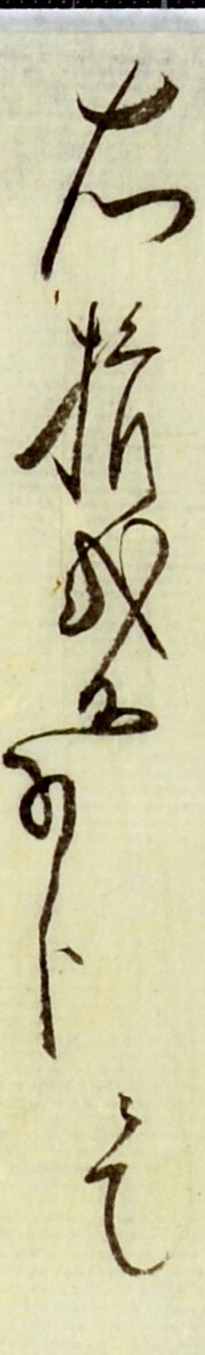右拾弐匁五分にて
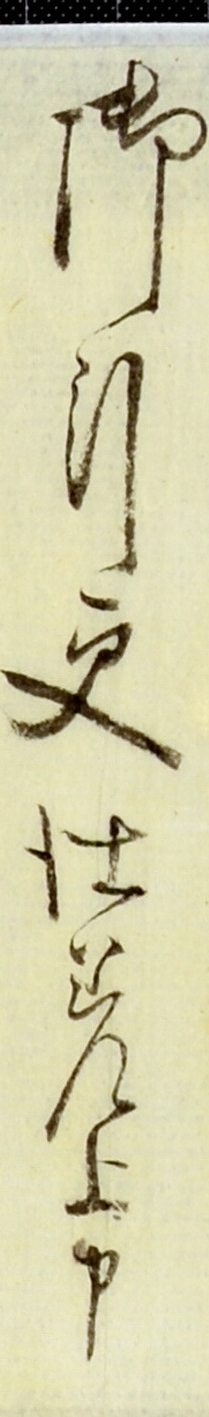御引受仕差上申
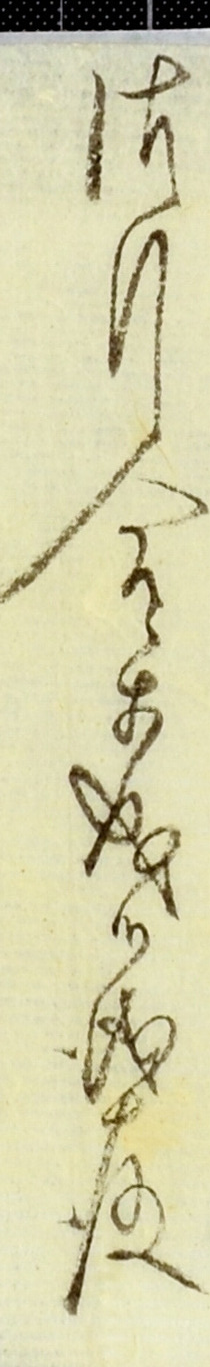御引合に相成候儀故
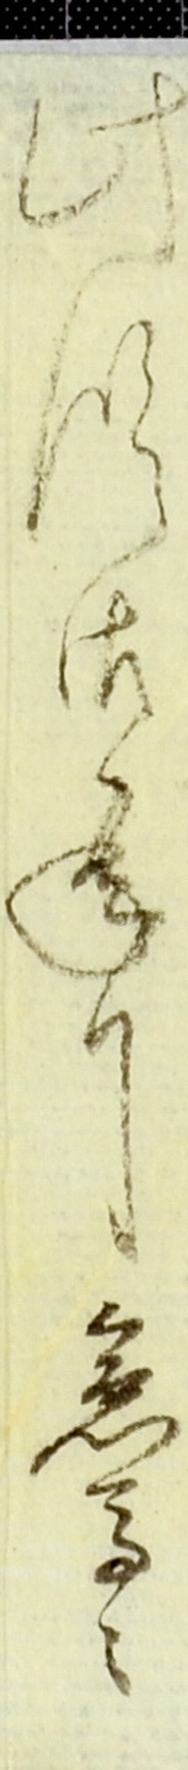此段御承引急馬に
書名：書状
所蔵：伊那市立高遠町図書館・合同会社AMANE
